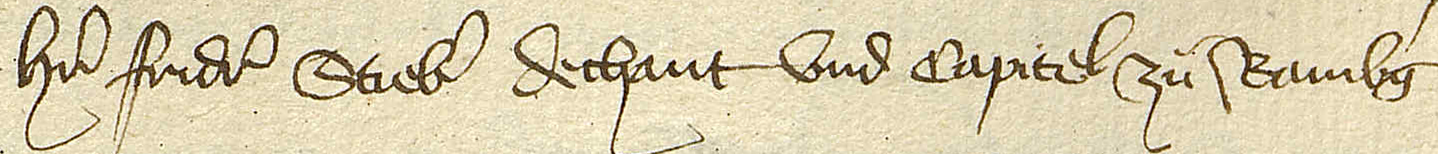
hn* fridr* Stieb* Dechant vnd Capitel cʒü Bambg*
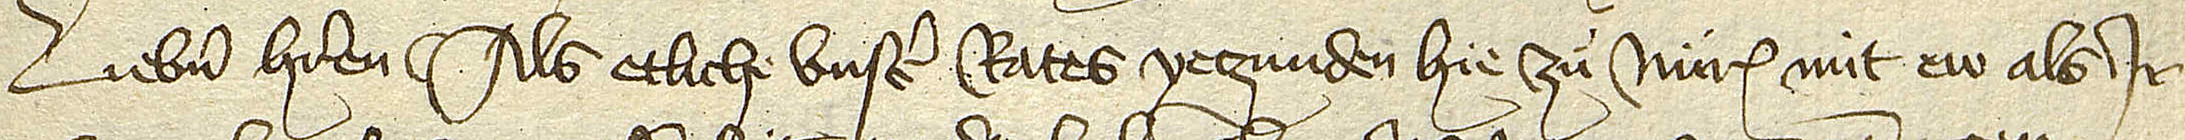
Liebn* hr*en / Als etliche vnſs* Rates yecʒunden hie cʒü Nür* mit ew als Ir
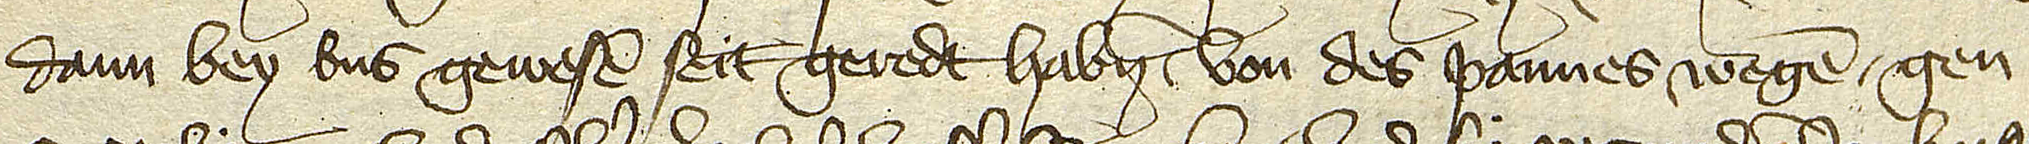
dann bey vns geweſe* ſeit geredt habn* / von des pannes wege* / gen
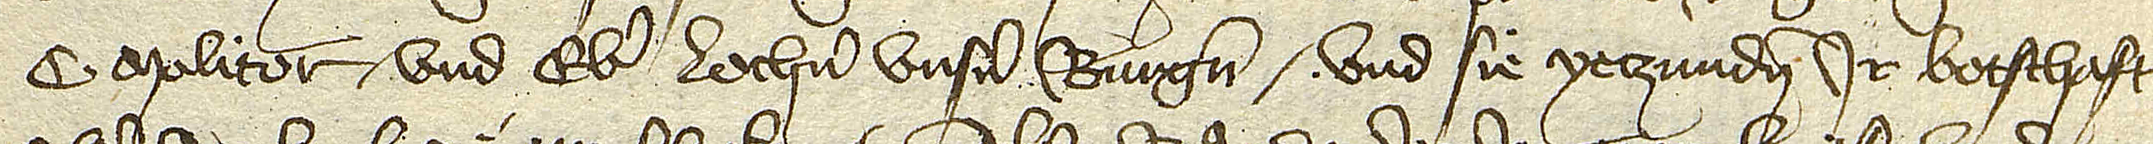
C . Molitor / vnd Eb* Lochn* vnſn* Burgn* / . vnd ſie yecʒundn* Ir botſchaft
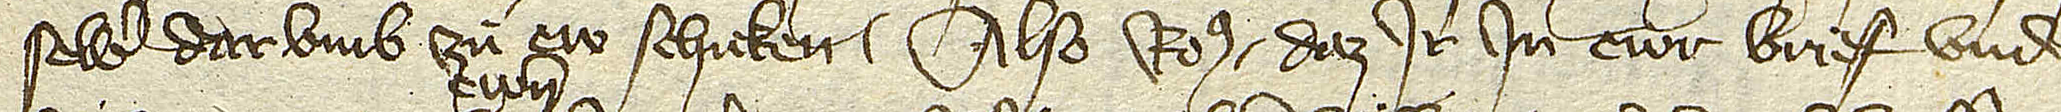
ſelb* darvmb cʒü ew ſchicken / Alſo Ro* / daʒ Ir In ewr brief vnd
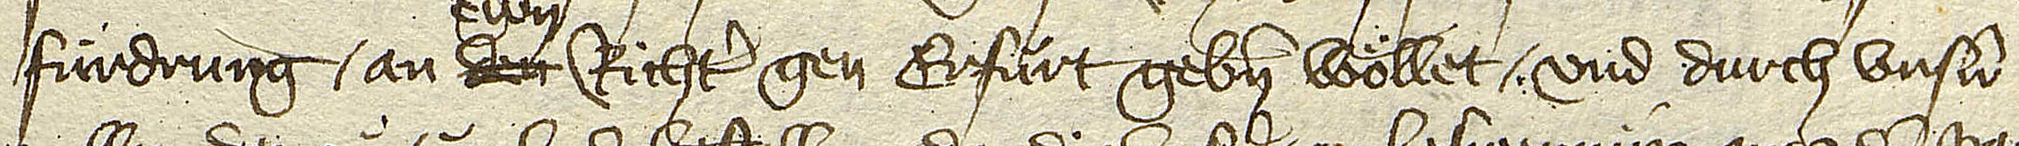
fürdrung / an den Richt* gen Erfürt gebn* wöllet / . vnd durch vnſn*
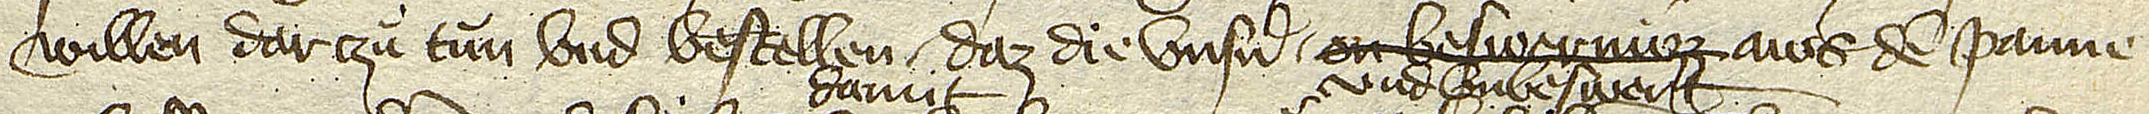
willen darcʒü tün vnd beſtellen / daʒ die vnſn* / on beſwernüʒʒ aws d* panne
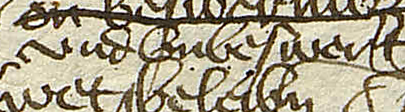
vnd vnbeſwert
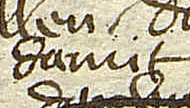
damit
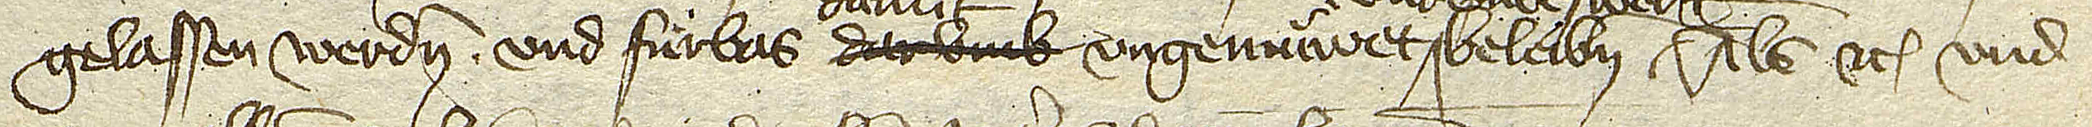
gelaſſen werdn* . vnd fürbas darvmb vngemüwet beleibn* / Als ec* vnd
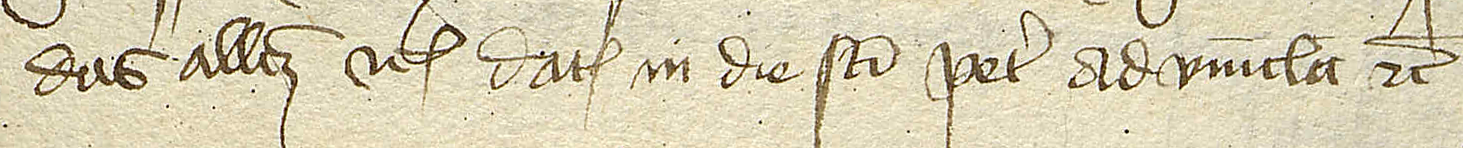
das allcʒ ec* dat* in die ſci* pet* ad vincla* ec*
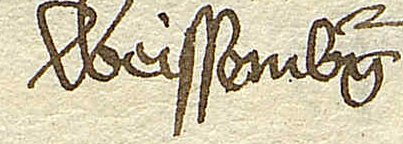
Weiſſemb*g
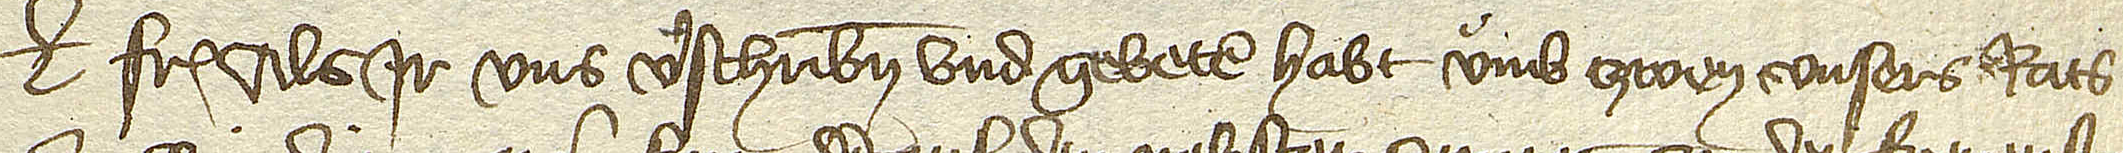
L* fr* Als Ir vns v*ſchribn* vnd gebete* habt v̈mb cʒwen vnſers Rats
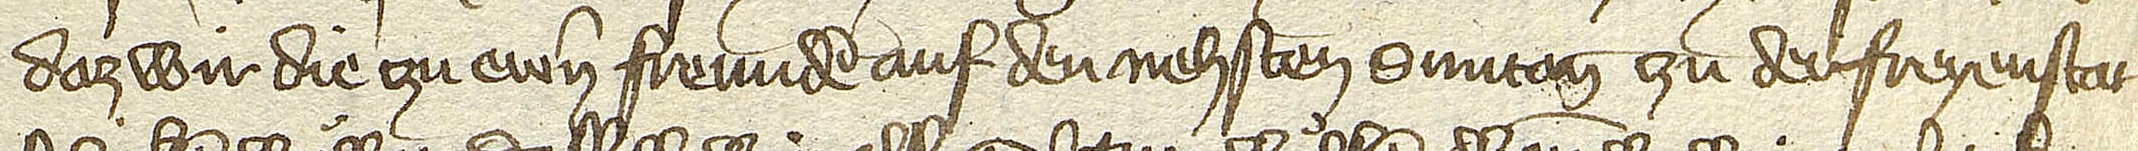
daʒ wir die cʒu ewn* freunde* auf den nehſten Suntag cʒu der freyenſtat
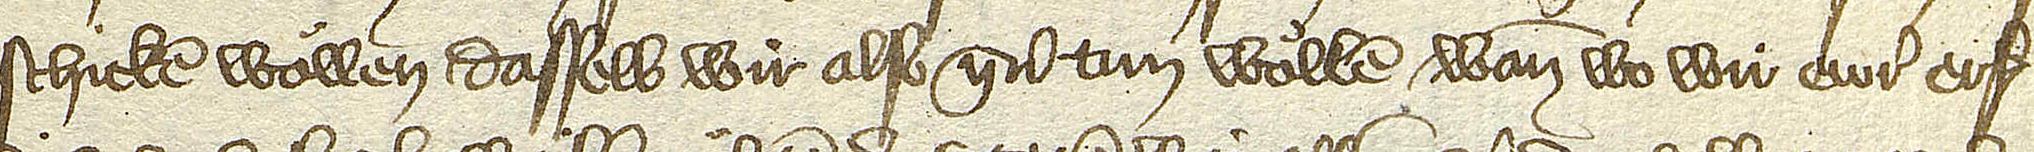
ſchicke* wöllen / daſſelb wir alſo gn* tun wölle* / wan wo wir ewr* erſ*
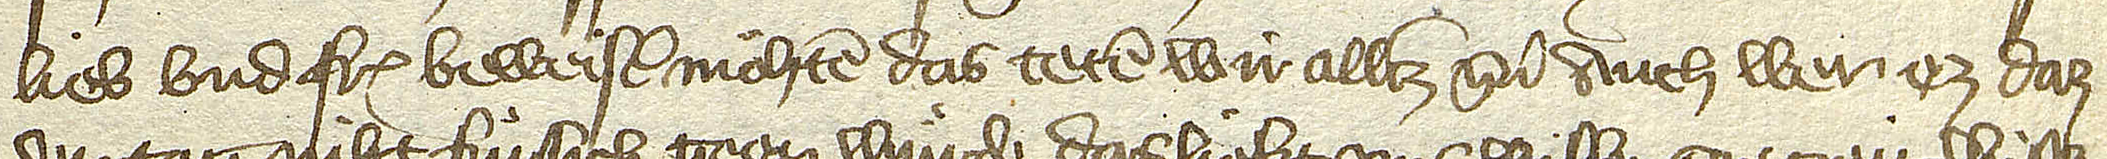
lieb vnd fr* beweiſe* möhte* das tete* wir allcʒ* gn* Auch wer eʒ daʒ
